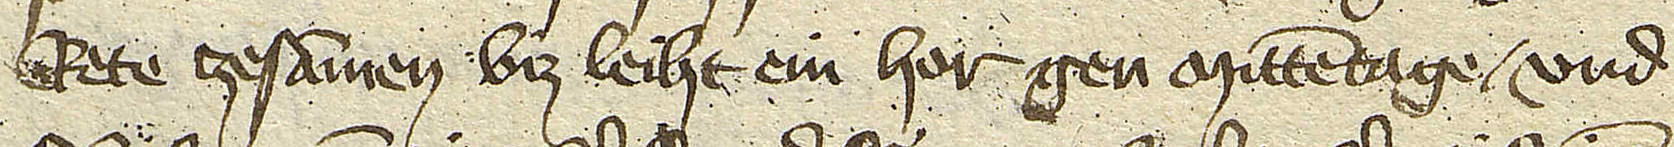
Rete cʒeſamen biʒ leiht ein hor gen Mitte*tage / vnd
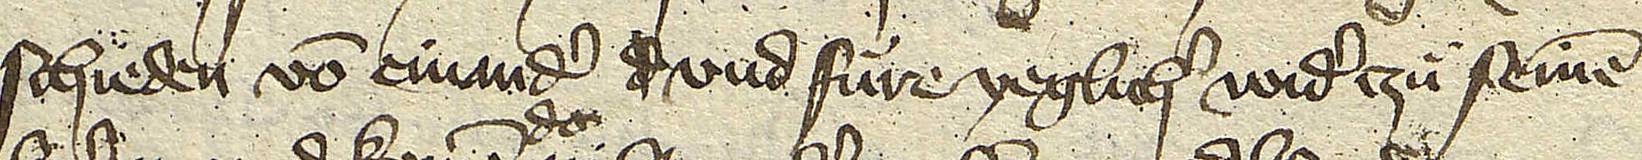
ſchieden vo* einand* d vnd füre / yeglich* wid* cʒü ſeine*
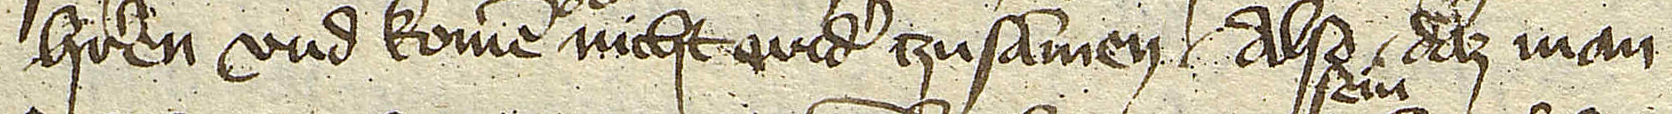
hr*en vnd kome* nicht wid* cʒuſamen / Alſo / daʒ man
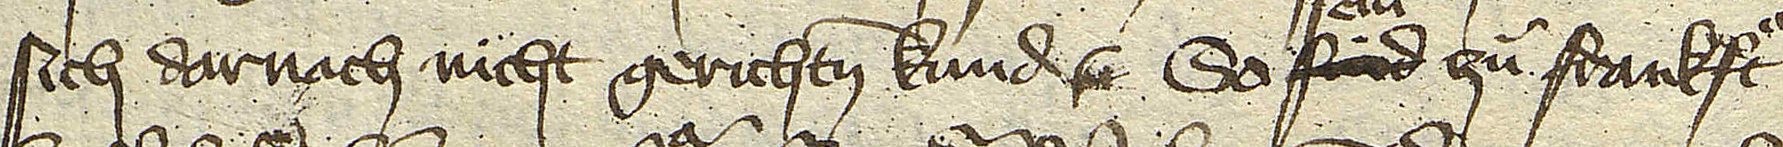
ſich darnach nicht gerichtn* kund / So ſind cʒü frankft*
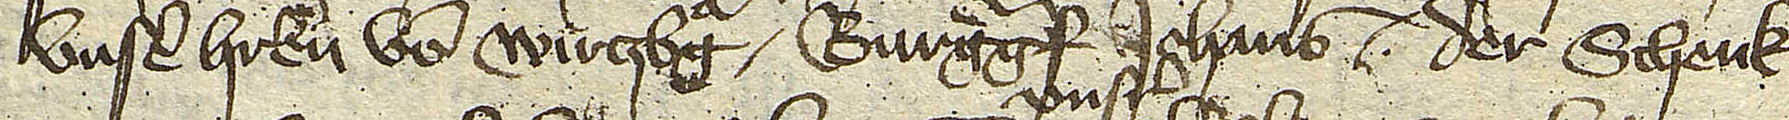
vnſe* hr*en vo* wircʒb*g / Burgg*f Iohans / . der Schenk
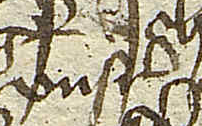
vnſr*
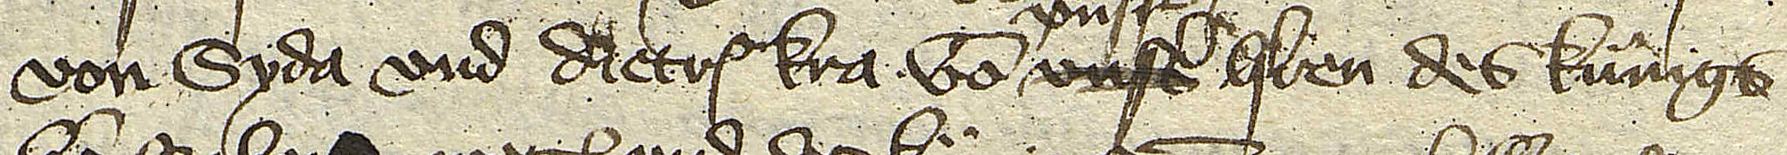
von Syda vnd dietr* kra vo* vnſs* h*ren des künigs
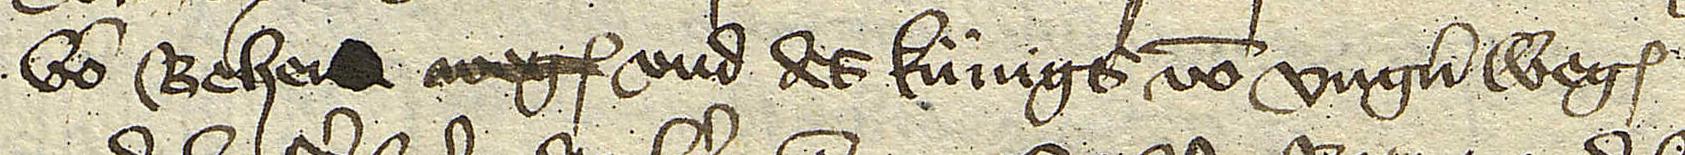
vo* Beheim weg* vnd des künigs vo* vngn* weg*
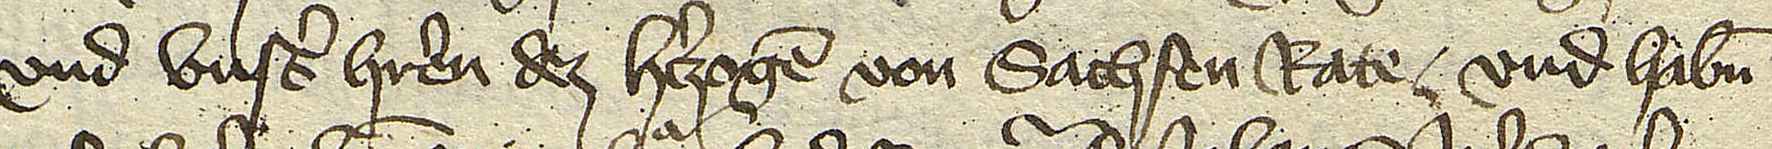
vnd vnſs* hr*en deʒ h*cʒoge* von Sachſen Rate / vnd habn*
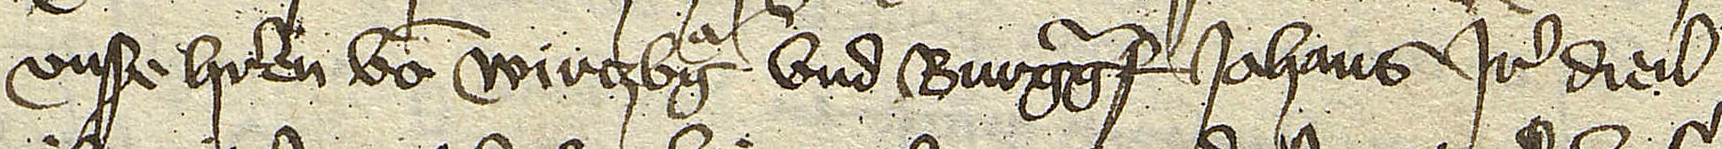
vnſ*e hr*en vo* wircʒb*g vnd Burgg*f Iohans Ir* dien*
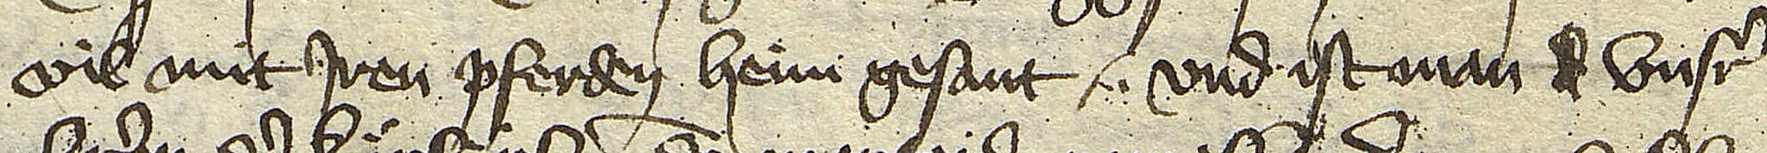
vil mit Iren pferden heim geſant / . vnd iſt man d vnſr*
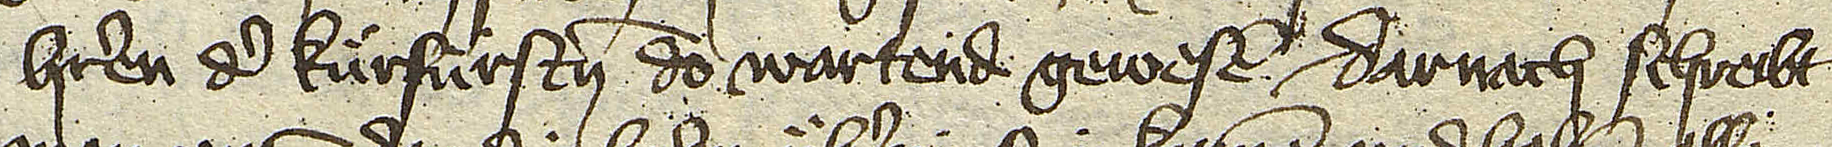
hr*en d* kürfürſtn* do wartend geweſe* / darnach ſchreibt
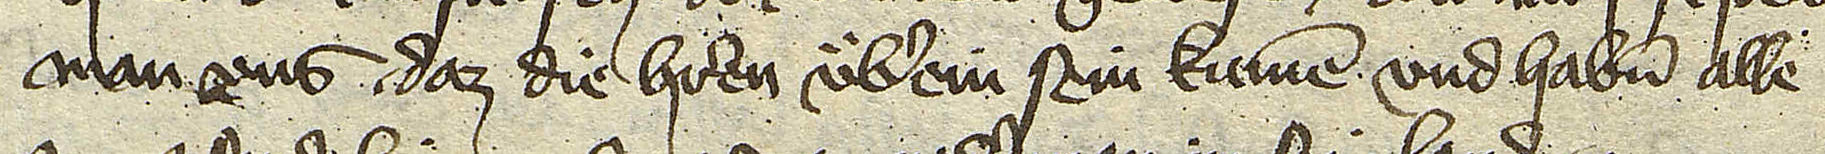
man vns / daʒ die hr*en v̈b*ein ſein kume* vnd habn* alle
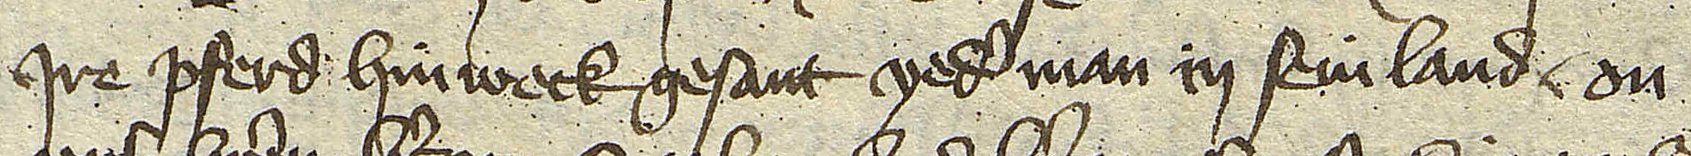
Ire pferd hinweck geſant yed* man in ſein land / on
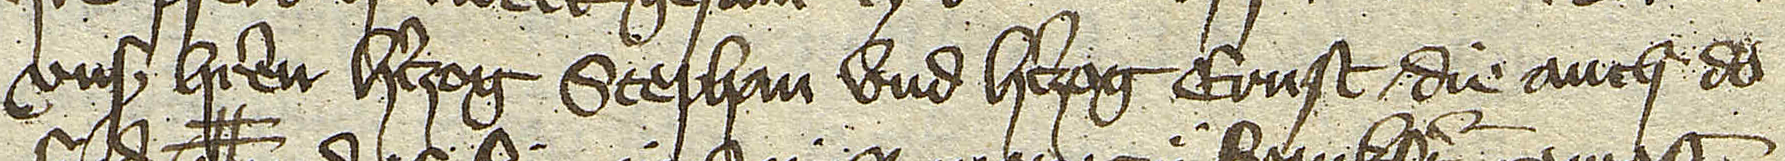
vnſ* hr*en h*cʒog Stephan vnd h*cʒog Ernſt / die auch do
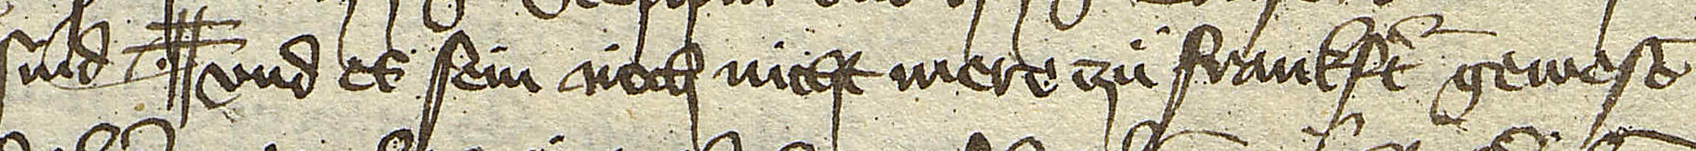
ſind / . vnd es ſein noch nicht mere cʒü frankf*t geweſe*
